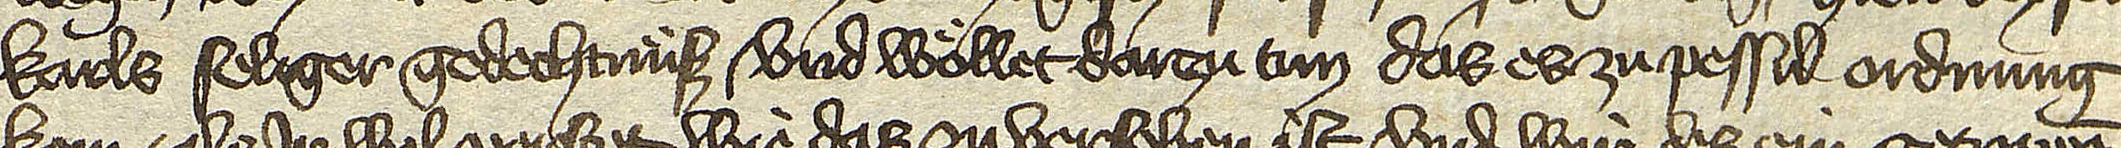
karls ſeliger gedechtnüſʒ / vnd wöllet darcʒu tun das es cʒu peſſn* ordnung
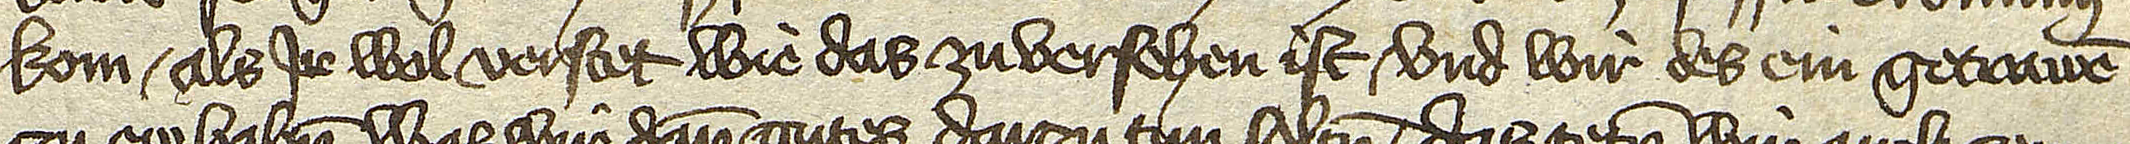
kom / als Ir wol verſtet wie das cʒuverſehen iſt / vnd wir des ein getrawe*
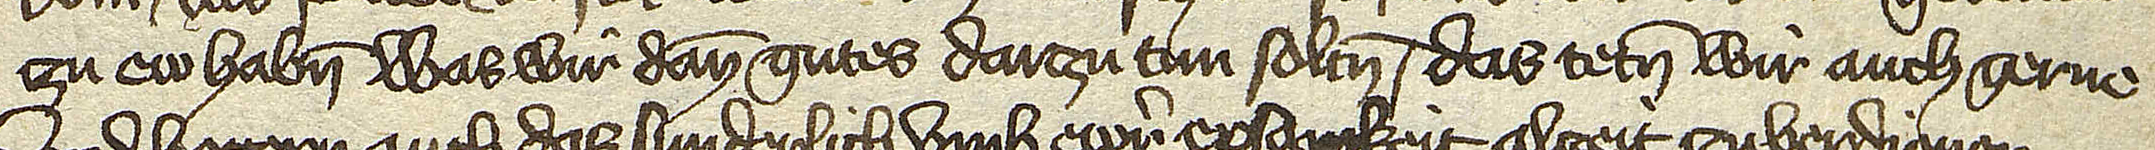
cʒu ew habn* was wir dan* gutes darcʒu tun ſoltn* / das tetn* wir auch gerne
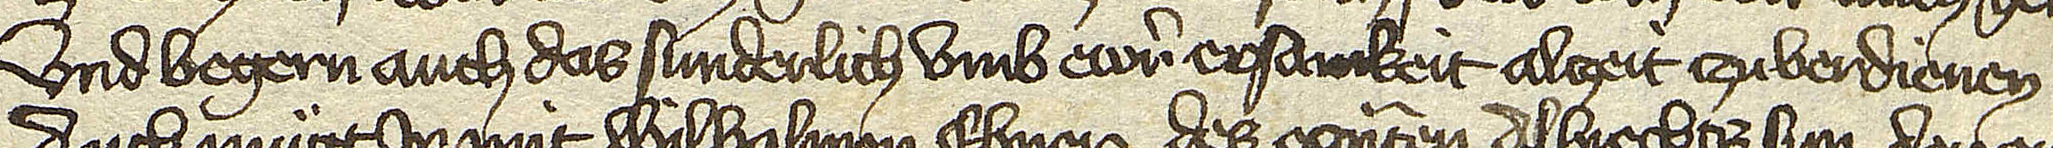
vnd begern auch das ſunderlich vmb ewr* erſamkeit alcʒeit cʒu verdienen
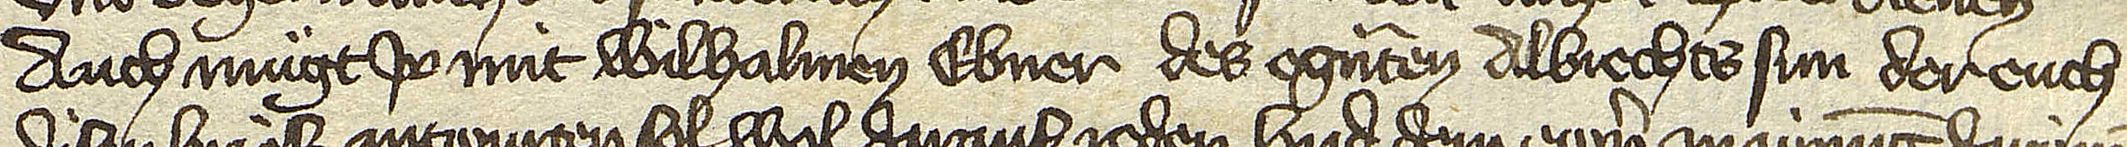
Auch mügt Ir mit wilhalmen Ebner des egnten*Albrechts ſun der euch
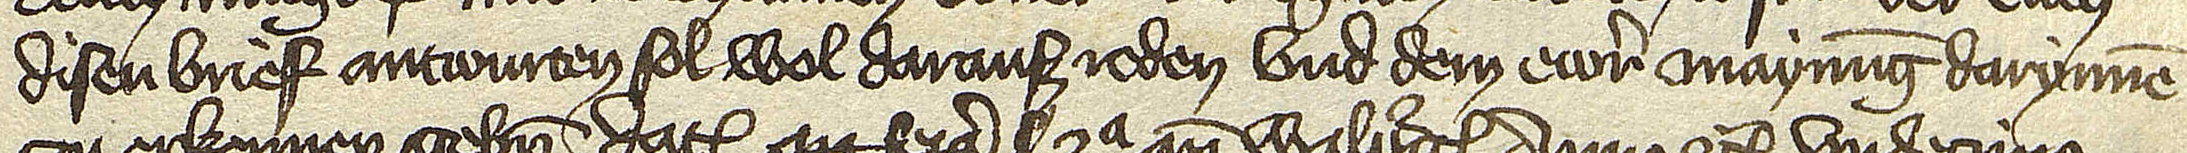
diſen brief antwurten ſol wol darauſʒ reden vnd dem ewr* maynug* darynne*
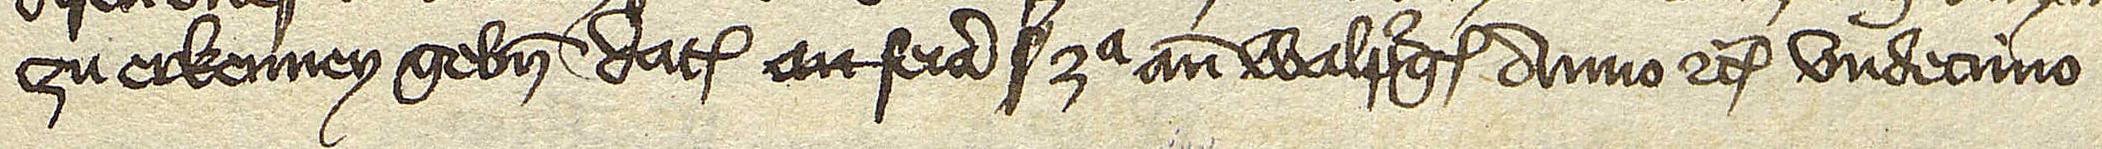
cʒu erkennen gebn* dat* an feia* ſ ʒ* walp*g* Anno ec* vndecimo
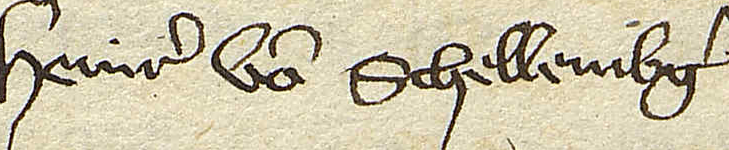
heinr* vo* Schellembg*
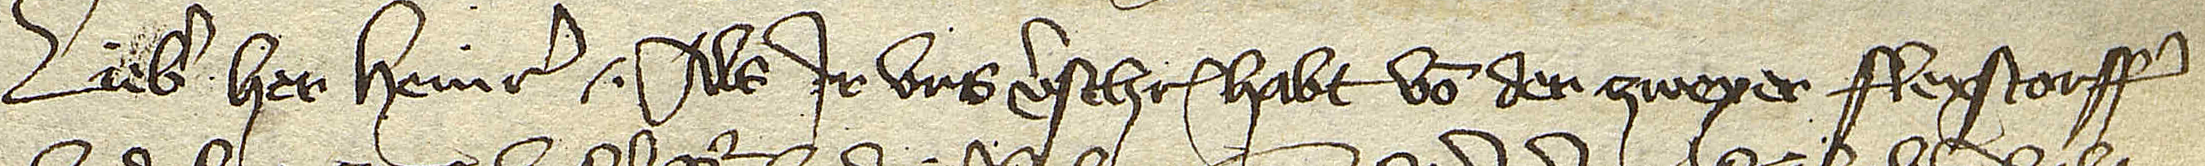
Lieb* her heinr* / . Als Ir vns v*ſchr* habt vo* der cʒweyer flexſtorff*
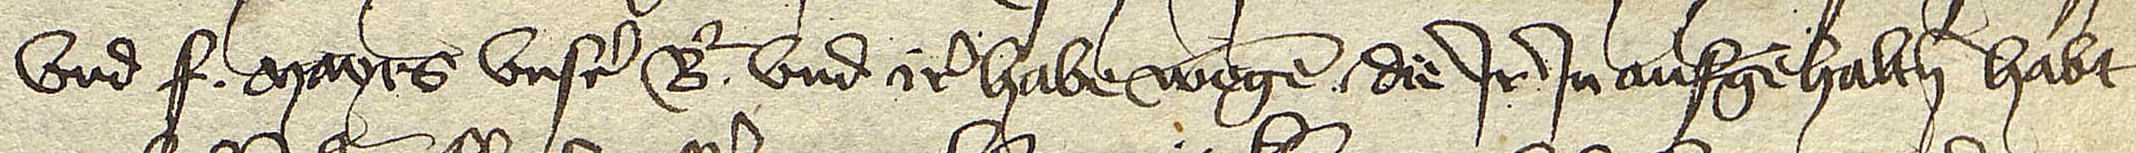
vnd f . Mayrs vnſr* B* vnd ir* habe wege* / die Ir In aufgehaltn* habt
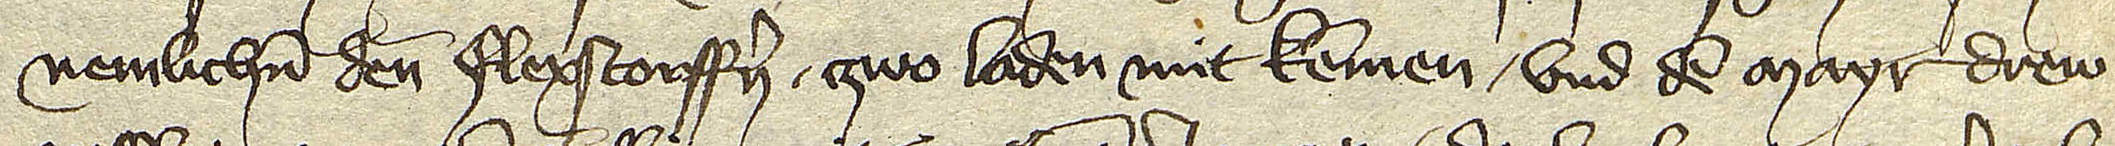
nemlichn* den Flexſtorff*n / cʒwo laden mit ke*men / vnd d* Mayr drew
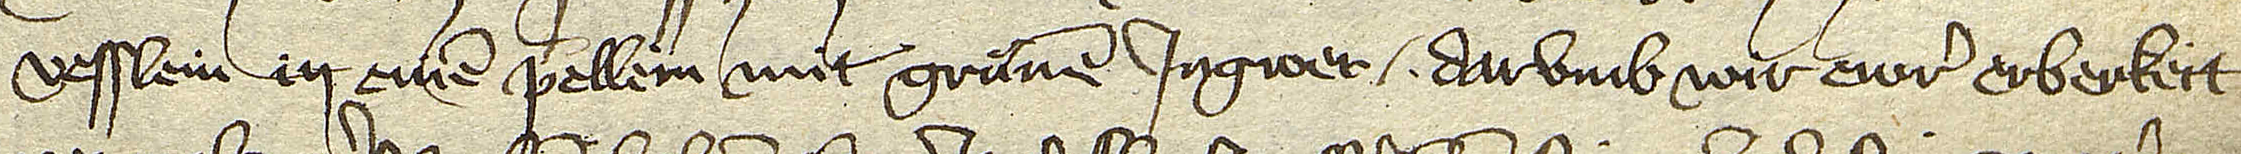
veſſlein in eine* pellein mit grüne* Ingwer / . darvmb wir ewr* erberkeit
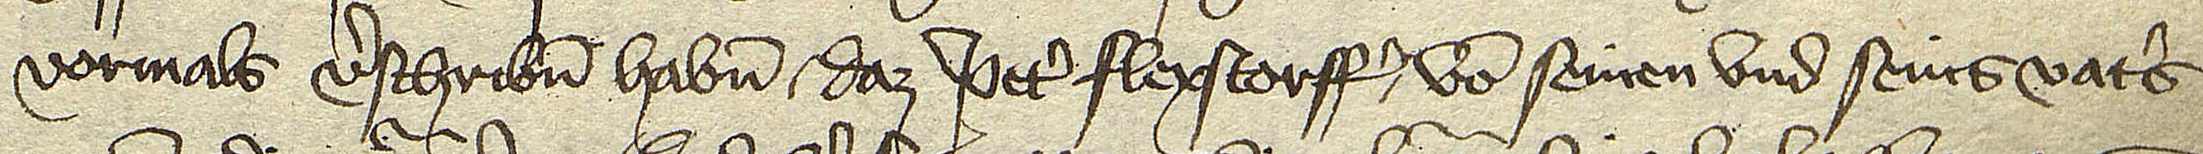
vormals v*ſchribn* habn* / daʒ Pet* flexſtorff* / vo* ſeinen vnd ſeins vat*s
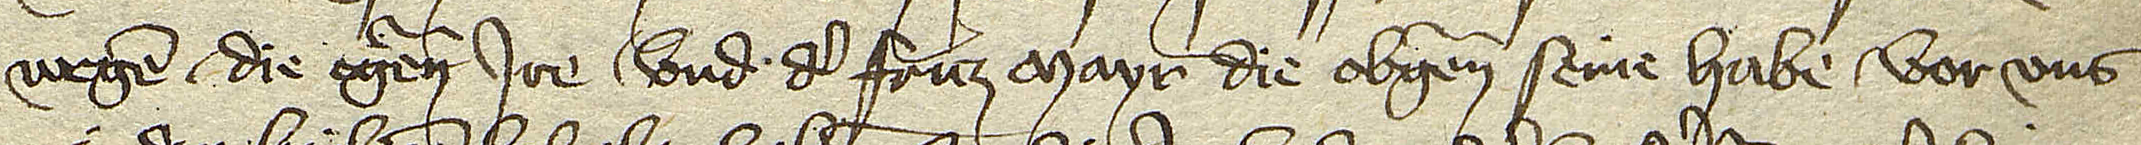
wege* / die egen* Ire / vnd d* fricʒ Mayr die obgen* ſeine habe / vor vns
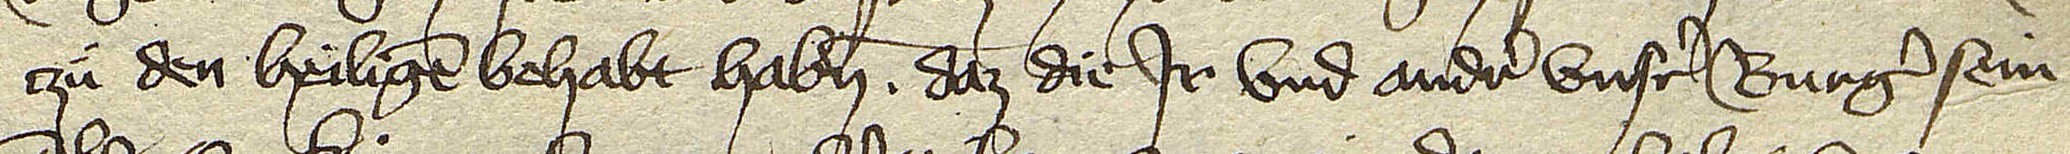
cʒü den heilige* behabt habn* . daʒ die Ir vnd andr* vnſr* Burg* ſein
